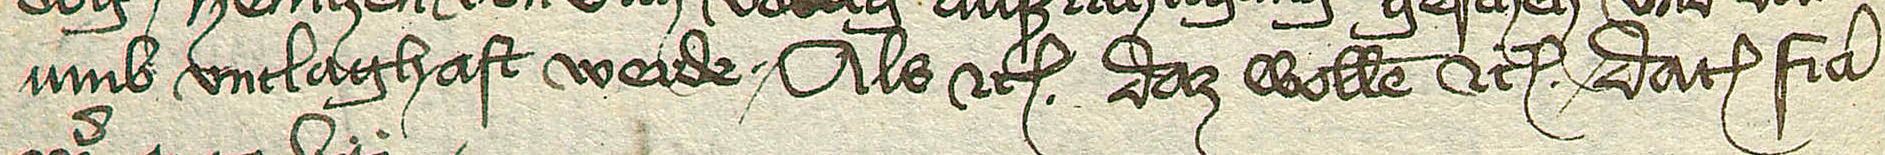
vmb vnclaghaft werden / Als ec* . daʒ wolle* ec* . / Dat* fia*
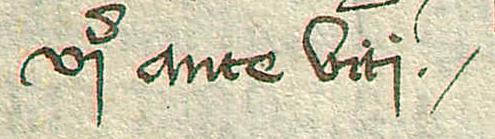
vi* ante viti . /
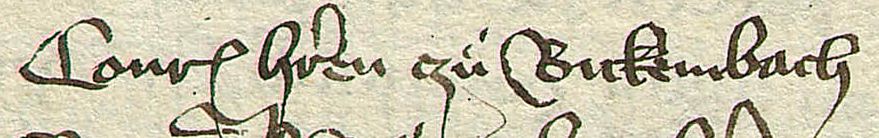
Conr* hr*en cʒü Bickembach
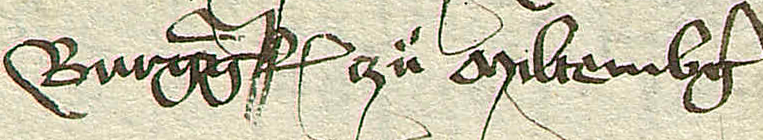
Burgg*ff* cʒü Miltemb*g
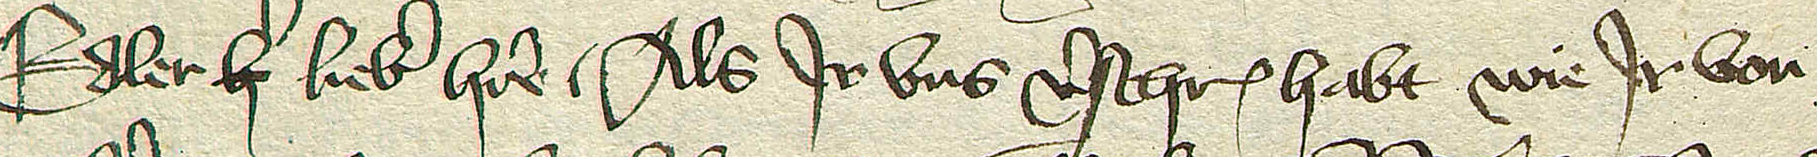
Edler h* lieb hr*e / Als Ir vns v*ſchr* habt wie Ir von
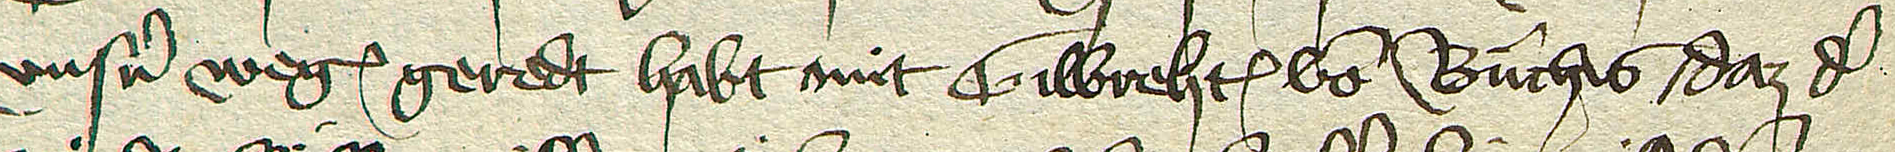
vnſn* weg* geredt habt mit Gilbreht* vo* Buchs / daʒ d*
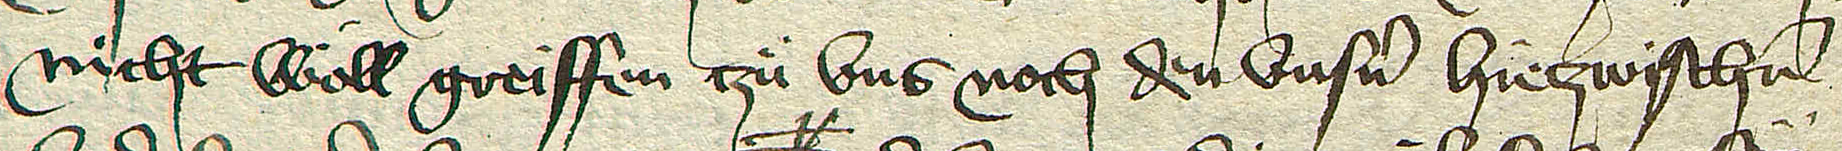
nicht wöll greiffen cʒü vns noch den vnſn* hiecʒwiſchn*
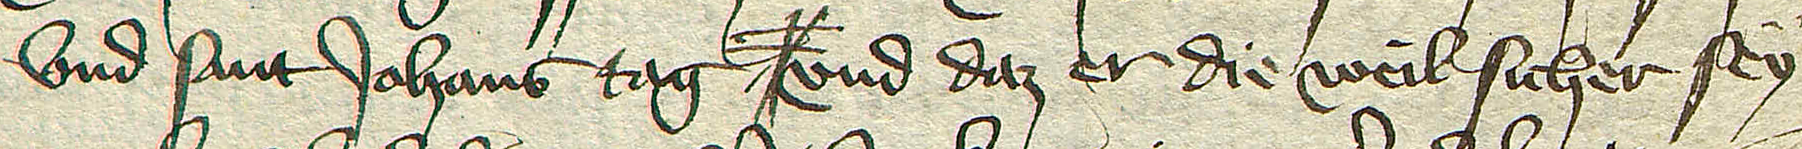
vnd ſant Iohans tag / vnd daʒ er die weil ſicher ſey
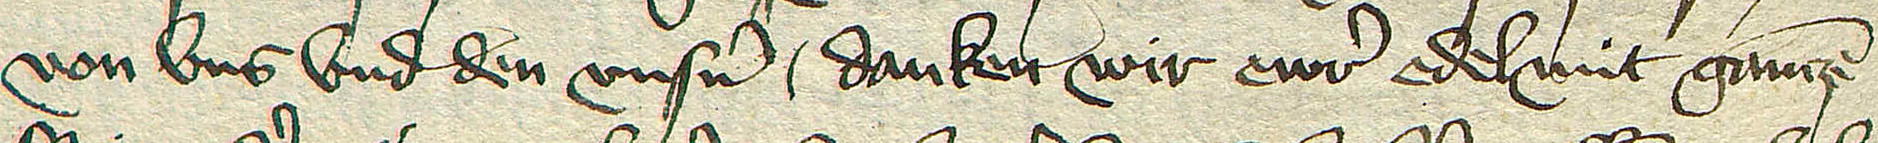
von vns vnd den vnſn* / danken wir ewr*edel mit gancʒe*
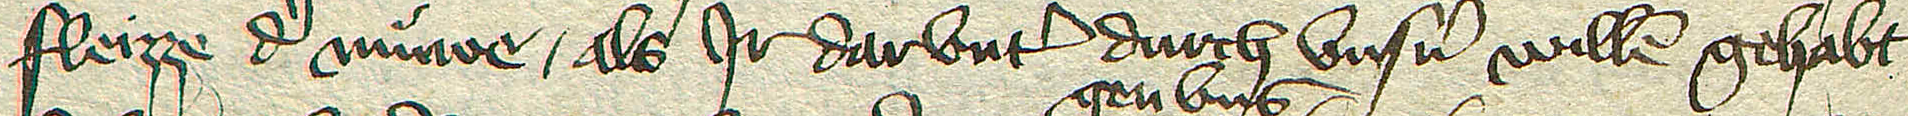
fleiʒʒe d* müwe / als Ir darvnt* durch vnſn* wille* gehabt
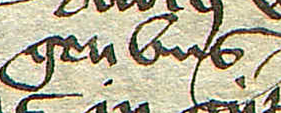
gen vns
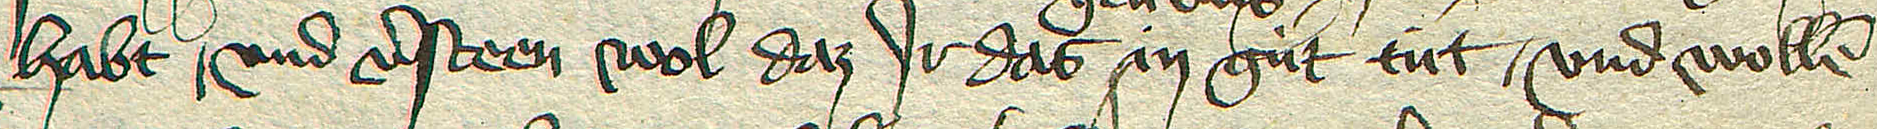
hat / vnd v*ſteen wol daʒ Ir das in güt tüt / vnd wolle*
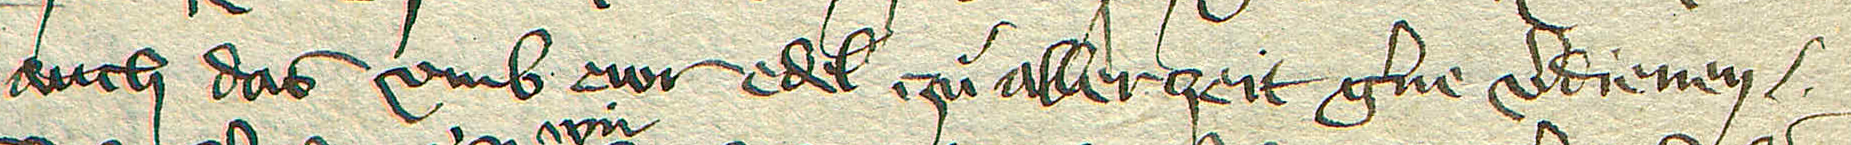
auch das vmb ewr edel cʒü allercʒeit g*ne v*dienen / .
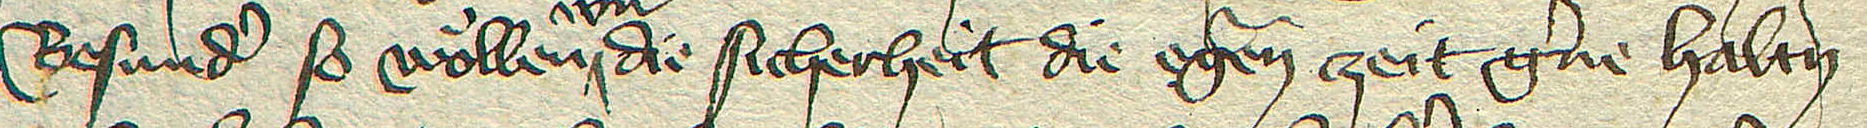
Beſund* ſo wöllen die ſicherheit die egen* cʒeit g*ne haltn*
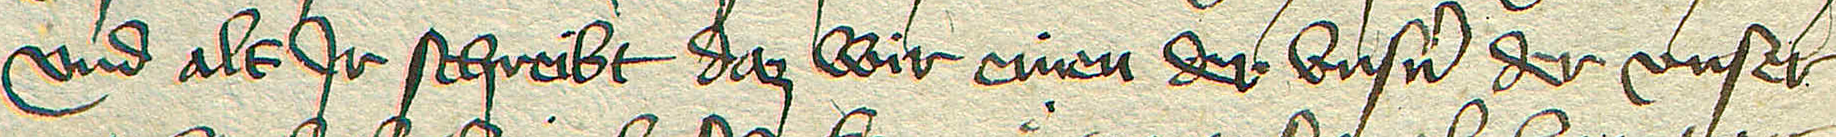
vnd als Ir ſchreibt daʒ wir einen der vnſn* der vnſer
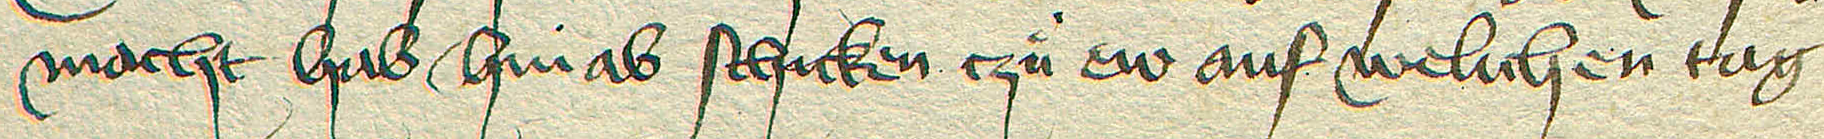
macht hab / hin ab ſchicken cʒü ew auf welichen tag
